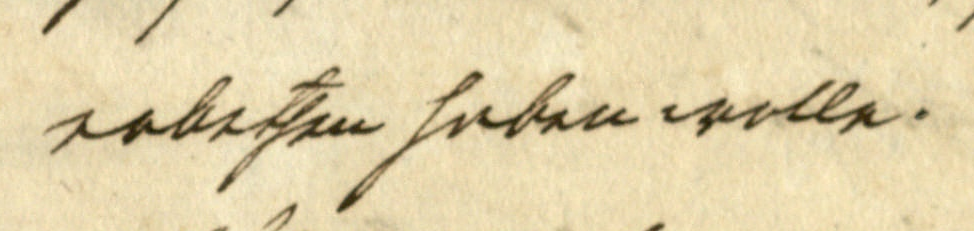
erbethen haben wolle.
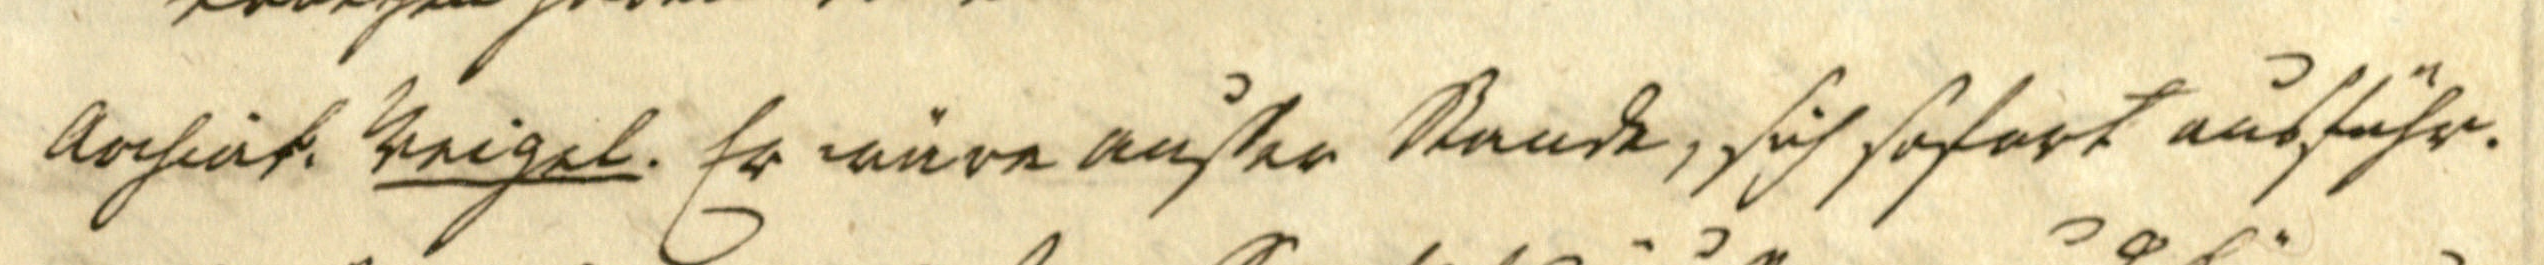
Archiat. Weigel. Er wäre ausser Stande, sich sofort ausführ¬
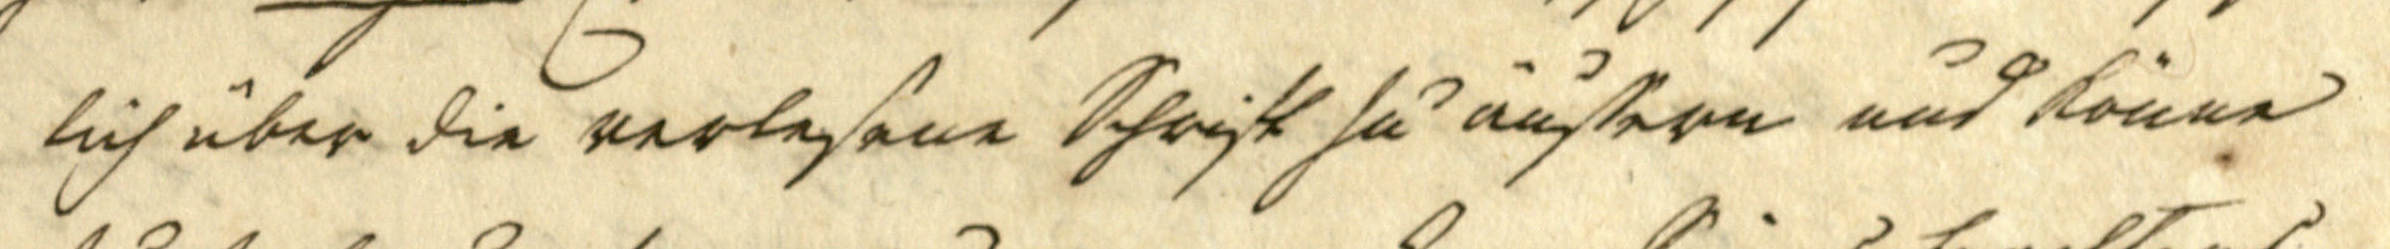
lich über die verlesene Schrift zu äussern und könne
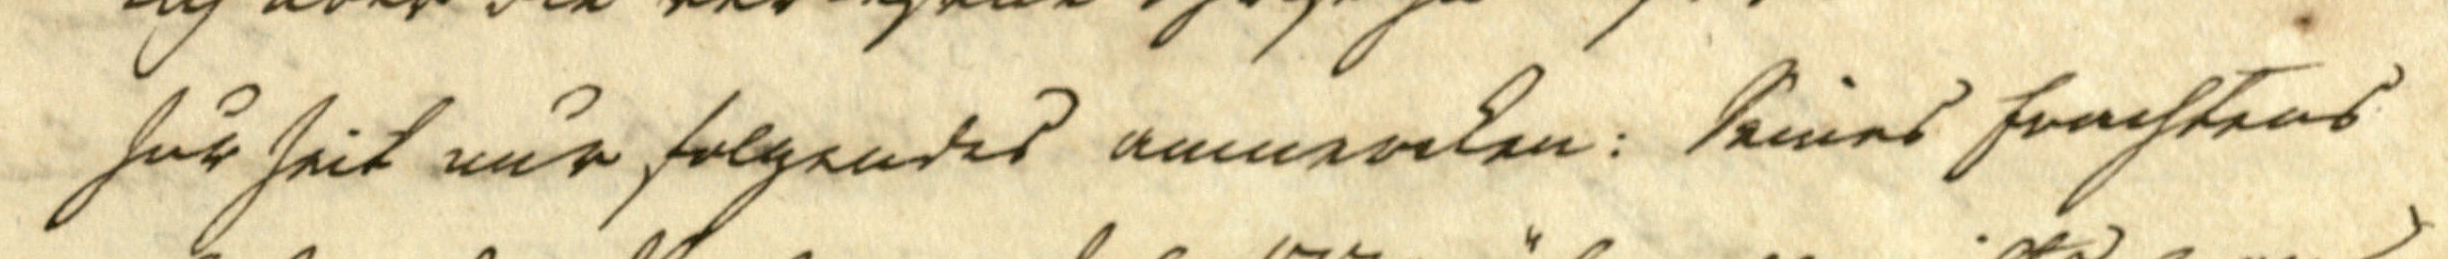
zur Zeit nur folgendes ammercken: Seines Erachtens
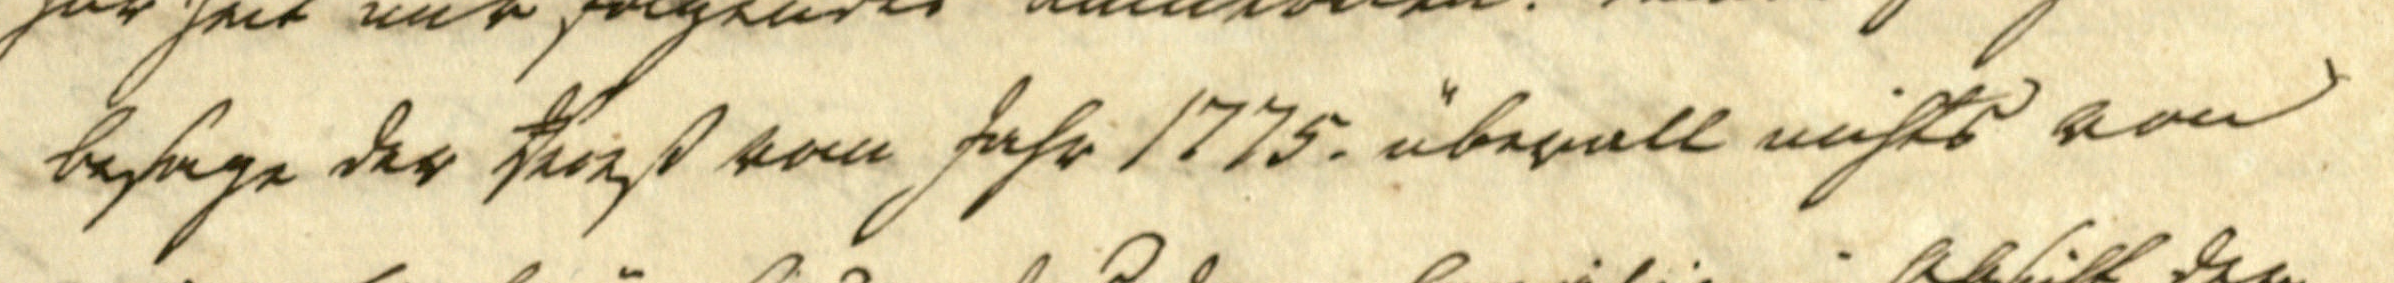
besage der Receß vom Jahr 1775. überall nichts von
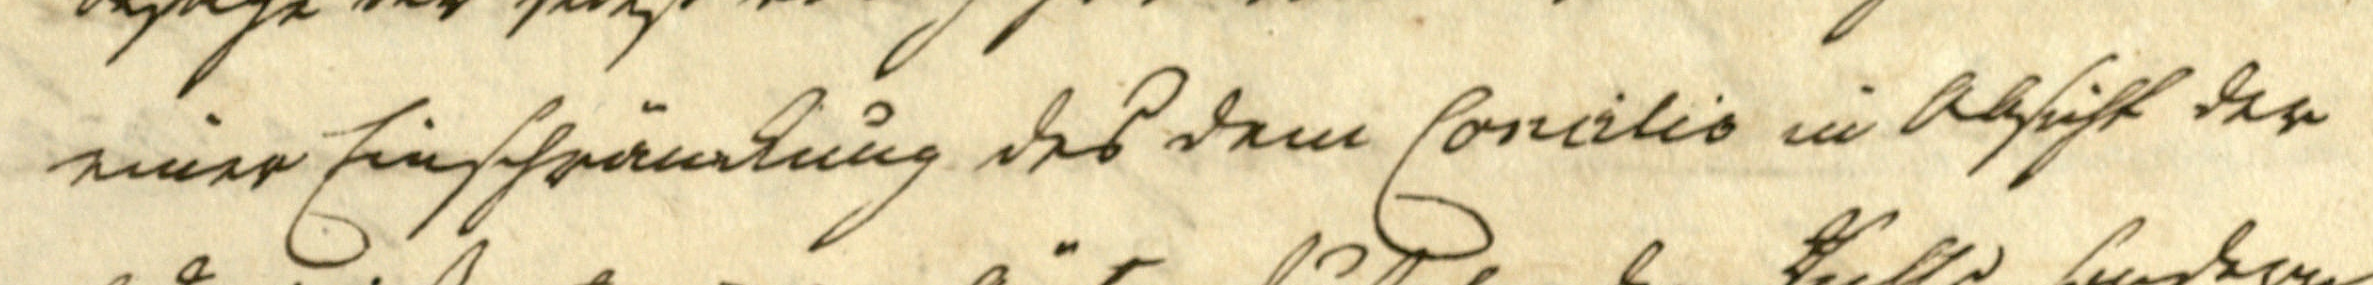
einer Einschränckung des dem Concilio in Absicht der
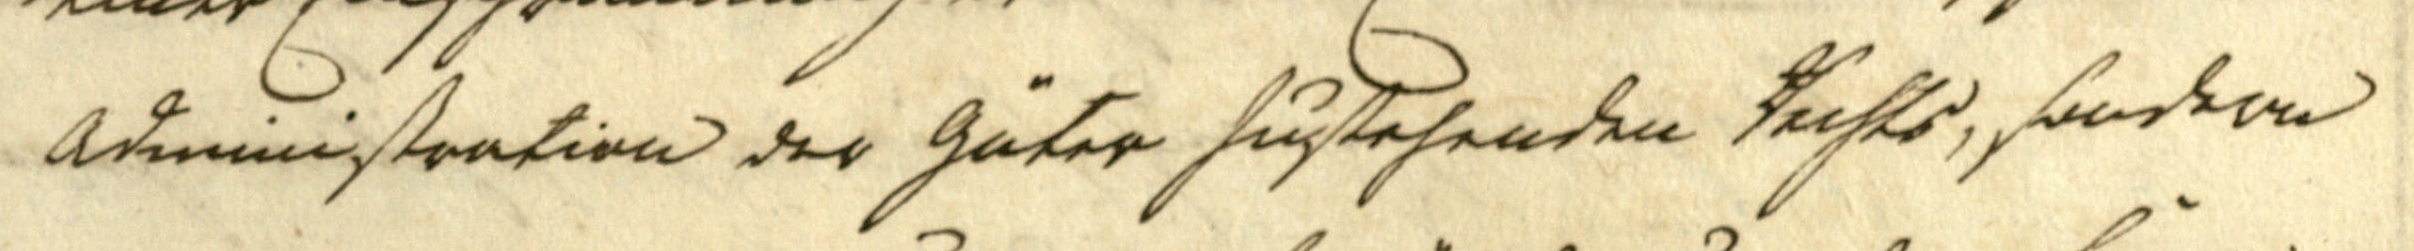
Administration der Güter zustehenden Rechts, sondern
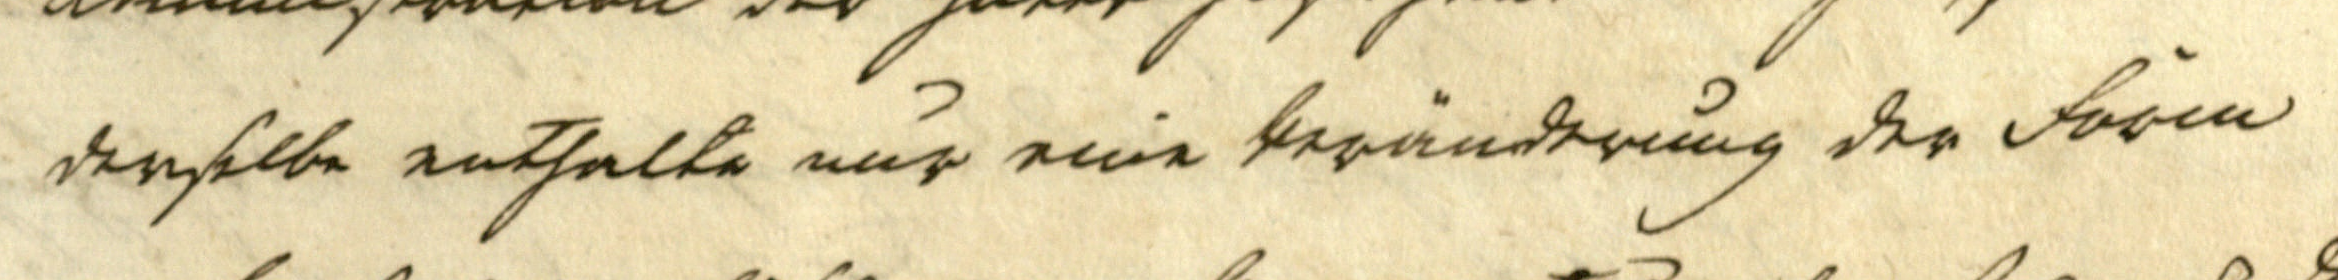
derselbe enthalte nur eine Veränderung der Form
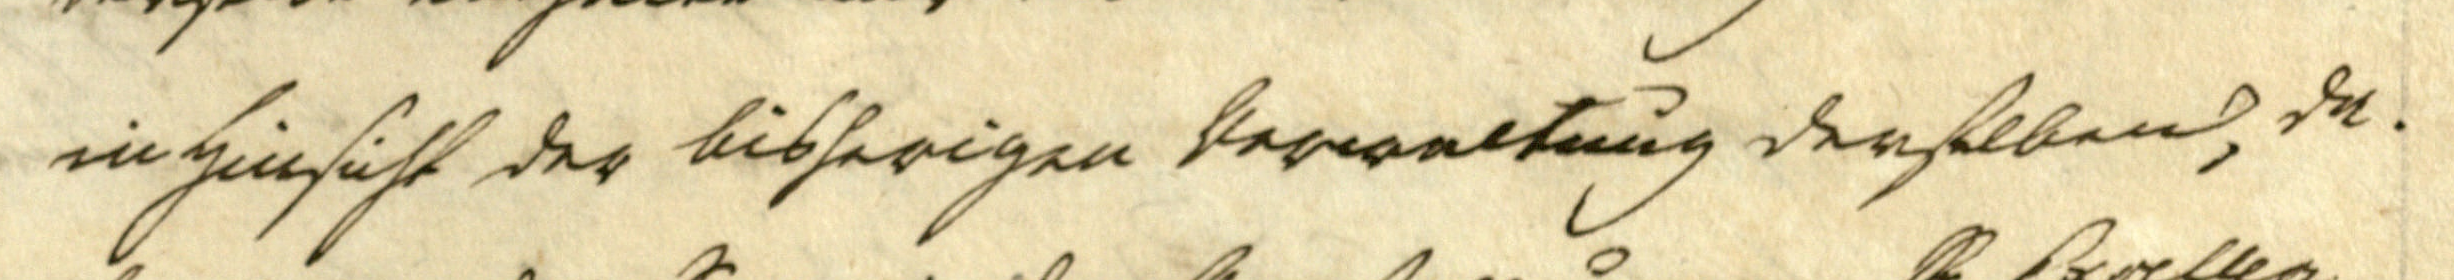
in Hinsicht der bisherigen Verwaltung derselben, da¬
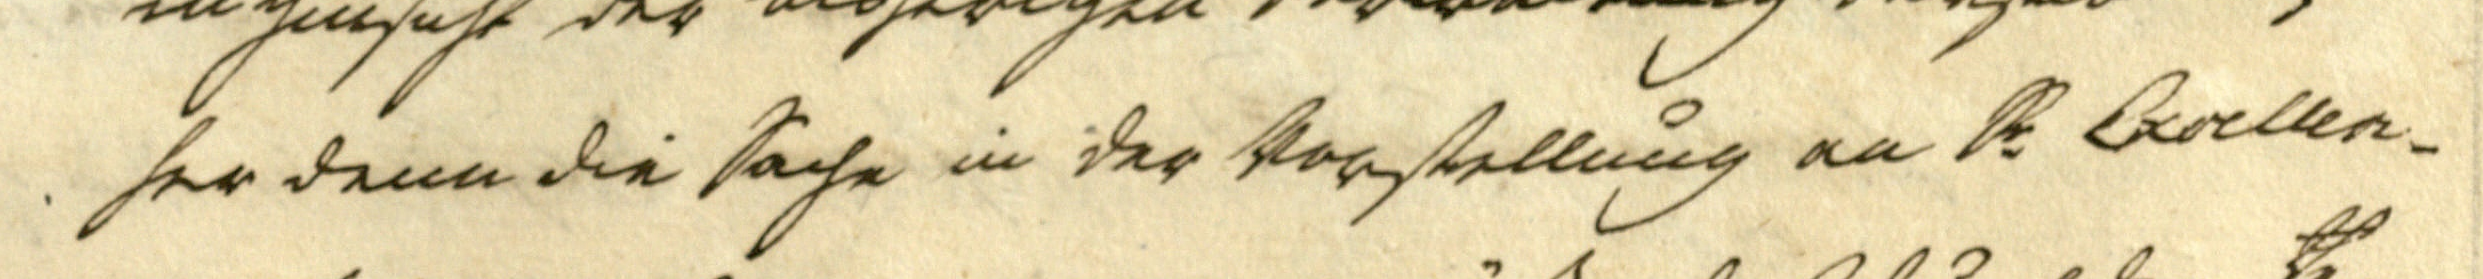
her denn die Sache in der Vorstellung an Sr Excellen¬
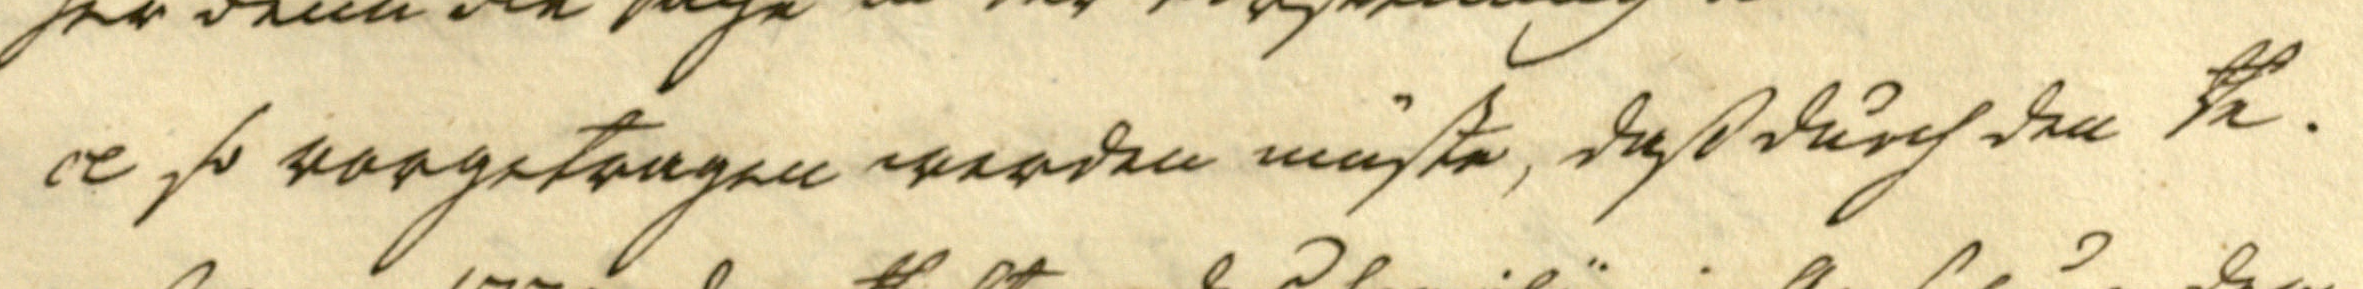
ce so vorgetragen werden müßte, daß durch den Re¬
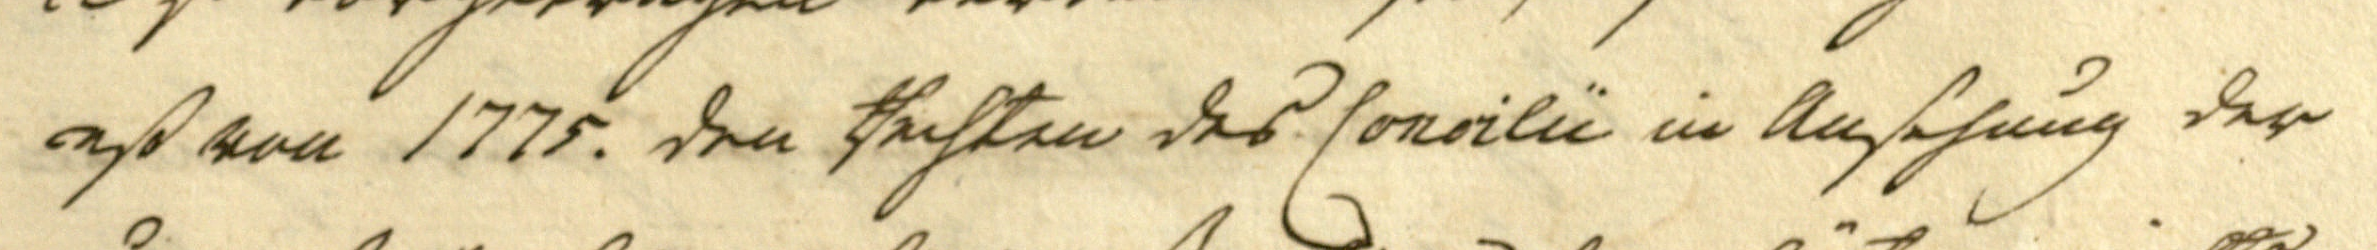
ceß von 1775. den Rechten des Concilii in Ansehung der
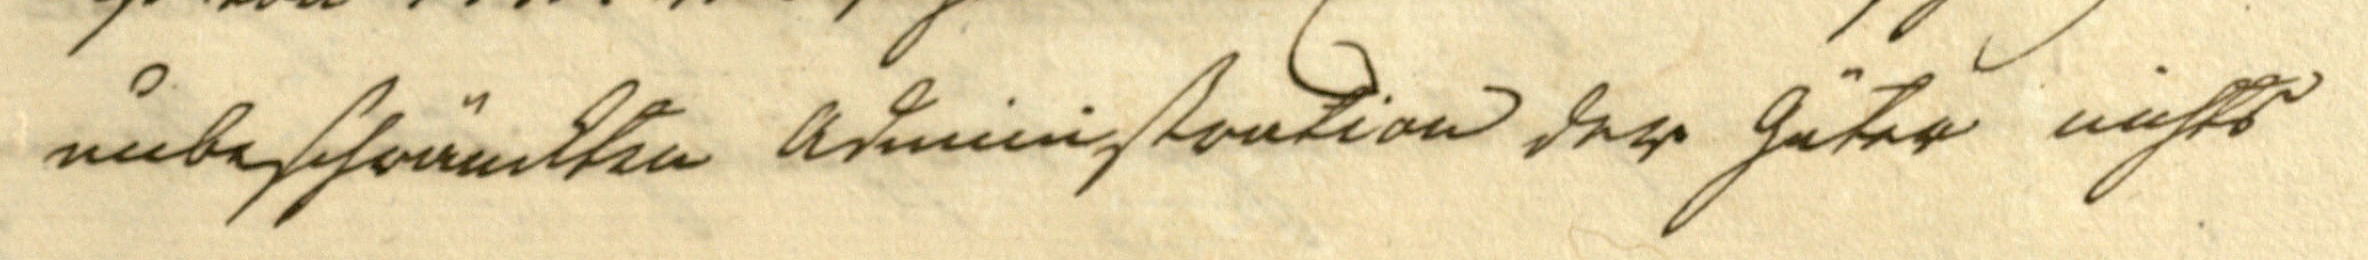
unbeschränckten Administration der Güter nichts
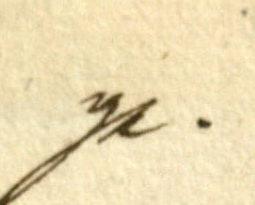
ge
